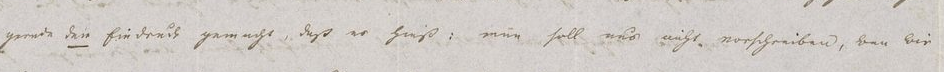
gerade den Eindruck gemacht, daß es hieß: man soll uns nicht vorschreiben, wen wir
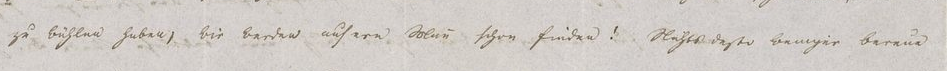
zu wählen haben, wir werden unsern Mann schon finden! Nichtsdesto weniger bereue
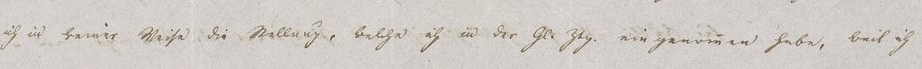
ich in keiner Weise die Stellung, welche ich in der Gl. Ztg. eingenommen habe, weil ich
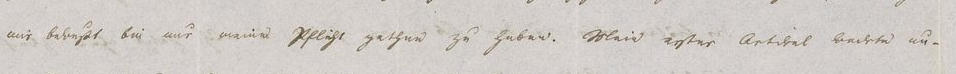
mir bewußt bin nur meine Pflicht gethan zu haben. Mein erster Artikel brachte un-
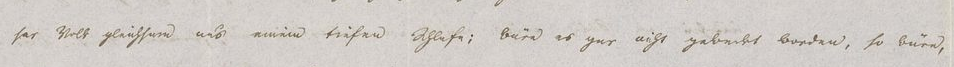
ser Volk gleichsam aus einem tiefen Schlafe; wäre es gar nicht geweckt worden, so wäre,
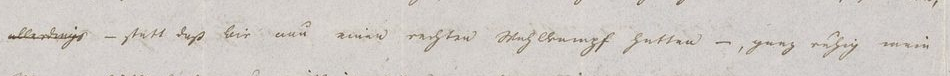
allerdings – statt daß wir nun einen rechten Wahlkampf hatten –, ganz ruhig mein
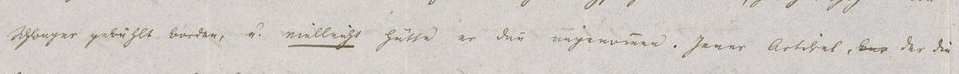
Schwager gewählt worden, u. vielleicht hätte er dann angenommen. Jener Artikel, warder die
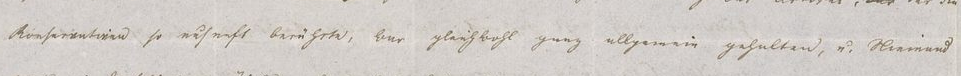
Konservativen so unsanft berührte, war gleichwohl ganz allgemein gehalten, u. Niemand
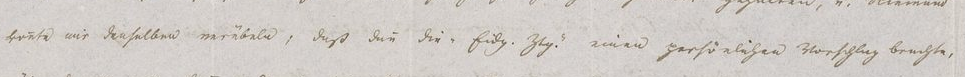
konnte mir denselben verübeln; daß dann die «Eidg. Ztg.» einen persönlichen Vorschlag brachte,
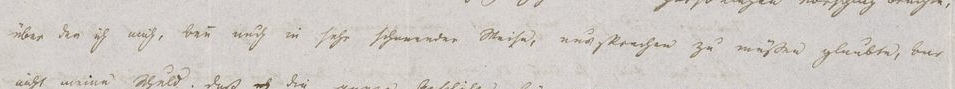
über den ich mich, wenn auch in sehr schonender Weise, aussprechen zu müßen glaubte, war
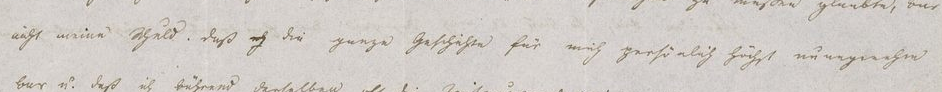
nicht meine Schuld. Daß ich die ganze Geschichte für mich persönlich höchst unangenehm
